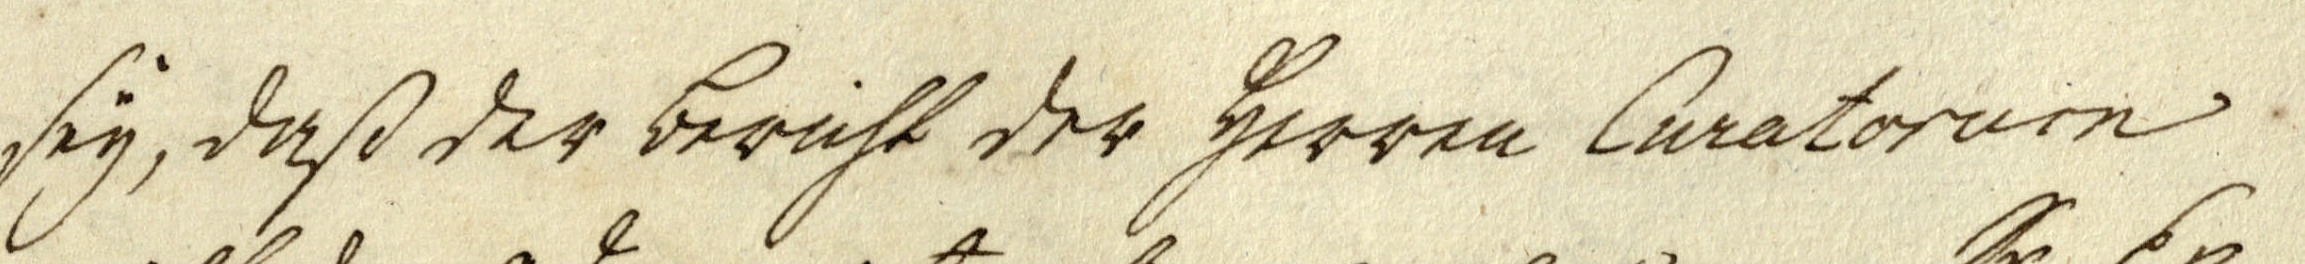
seÿ, daß der Bericht der Herren Curatorum
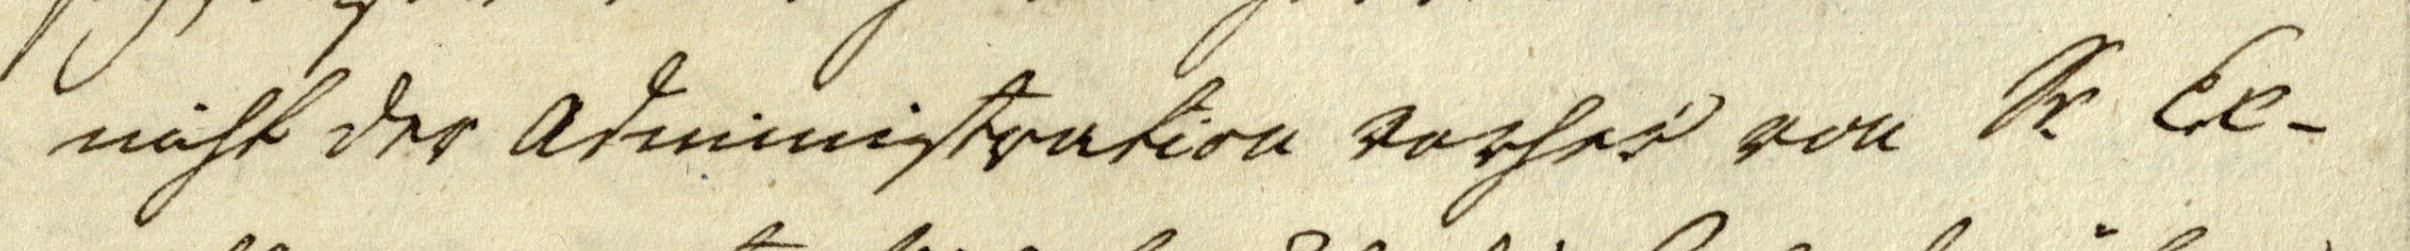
nicht der Administration vorher von Sr Ex¬
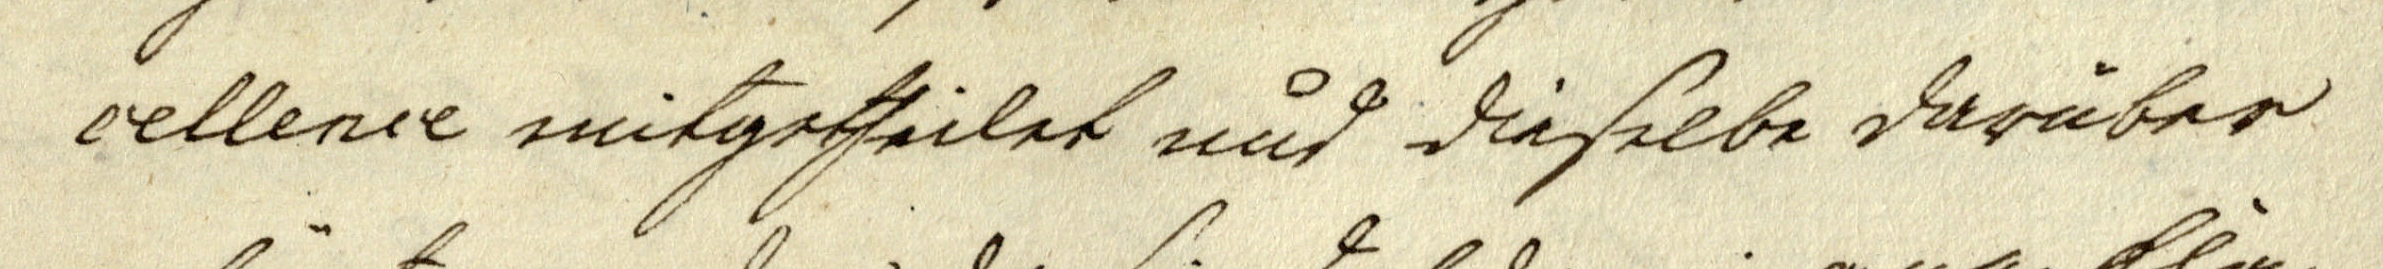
cellence mitgetheilet und dieselbe darüber
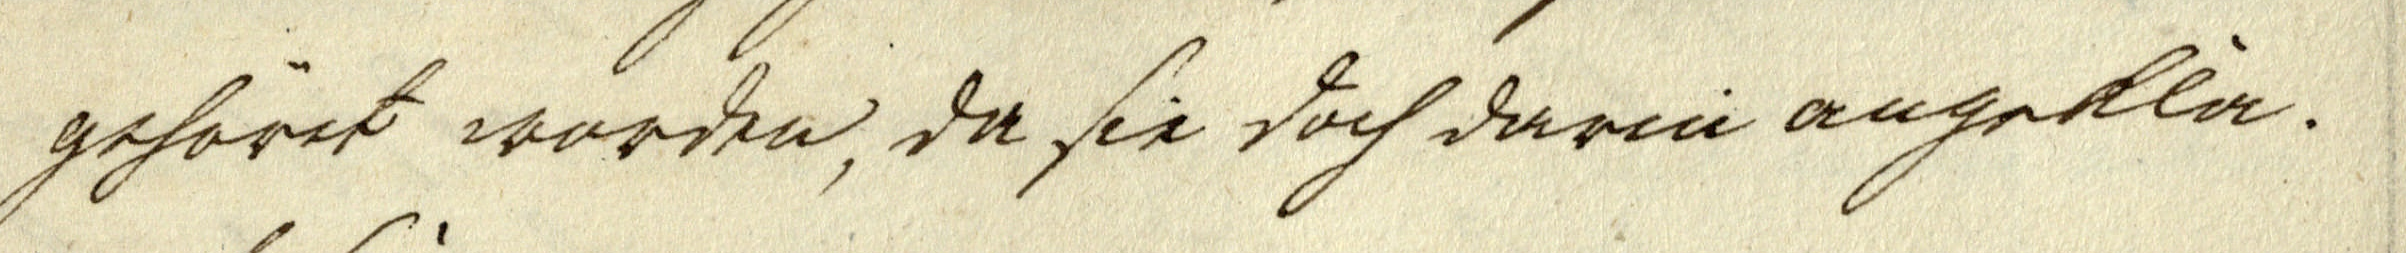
gehöret worden, da sie doch darin angekla¬
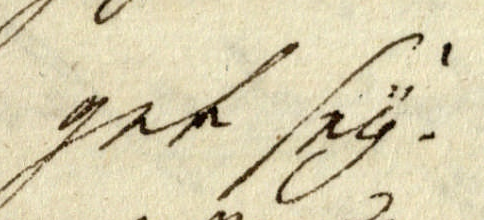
get seÿ.
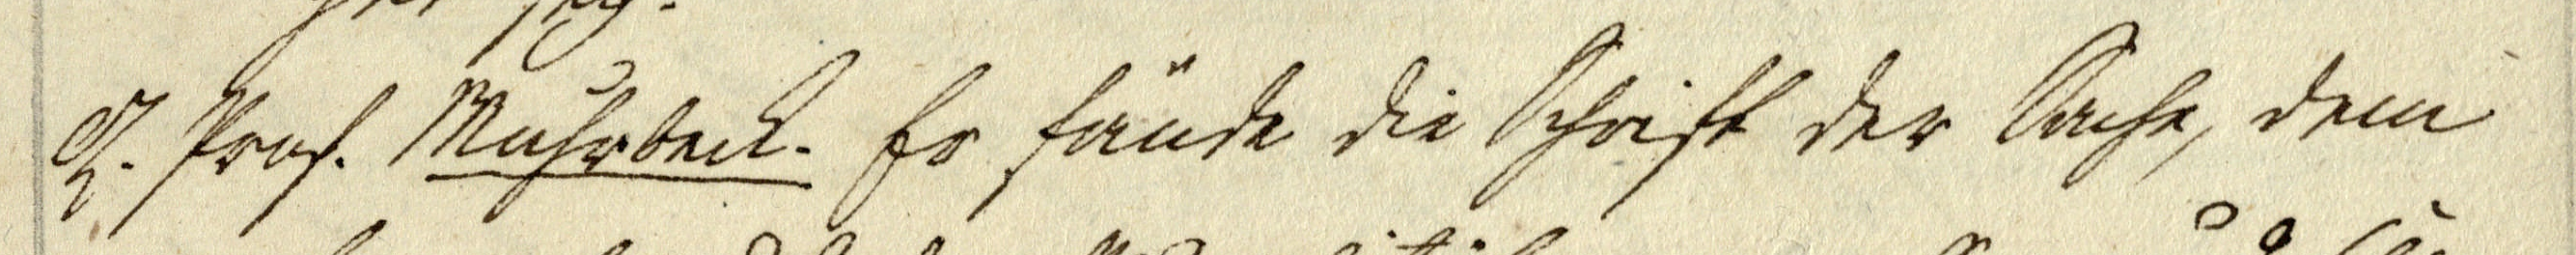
dh. Prof. Muhrbeck. Er fände die Schrift der Sache, dem
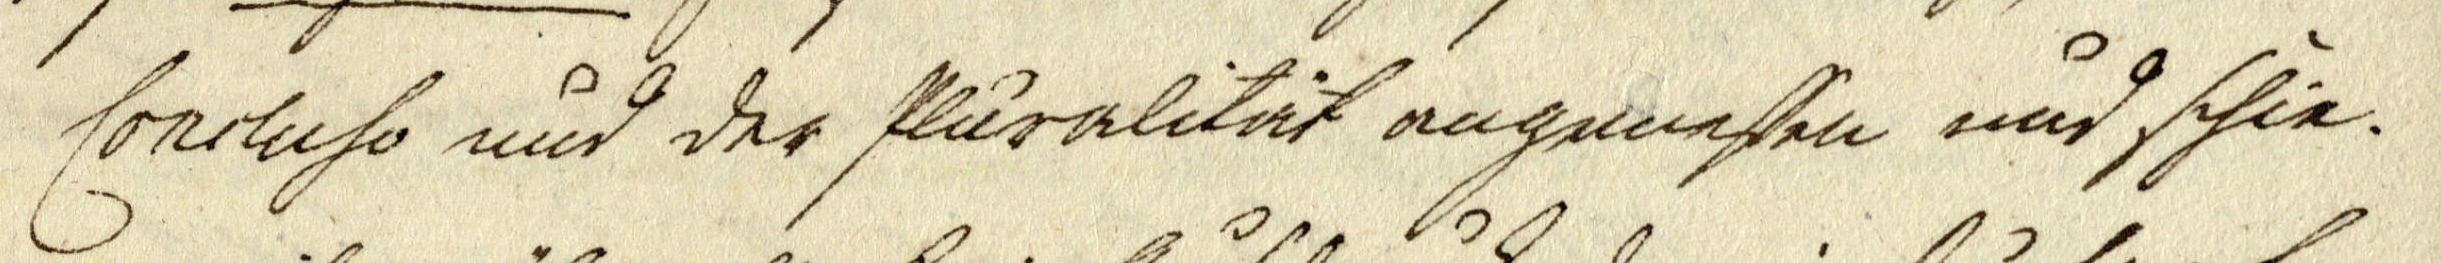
Concluso und der Pluralität angemessen und schie¬
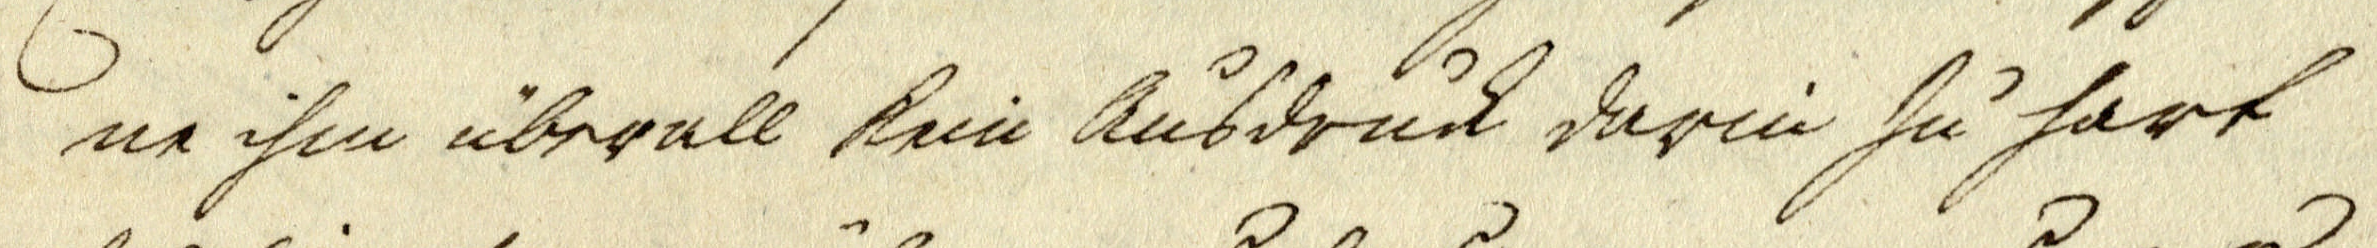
ne ihm überall kein Ausdruck darin zu hart
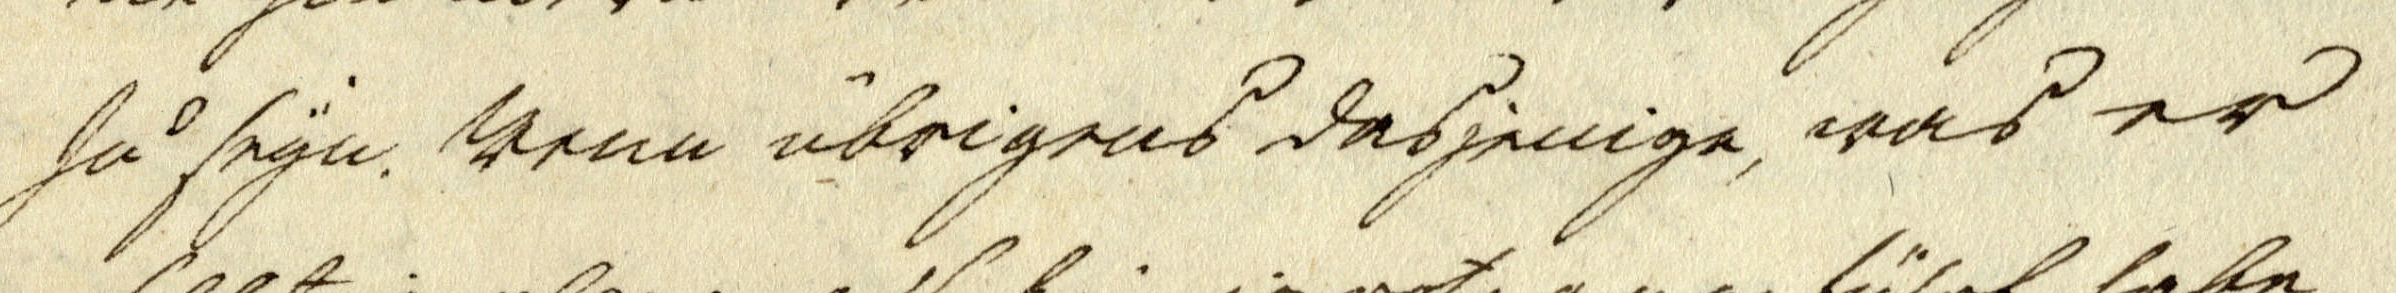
zu seÿn. Wenn übrigens dasjenige, was er
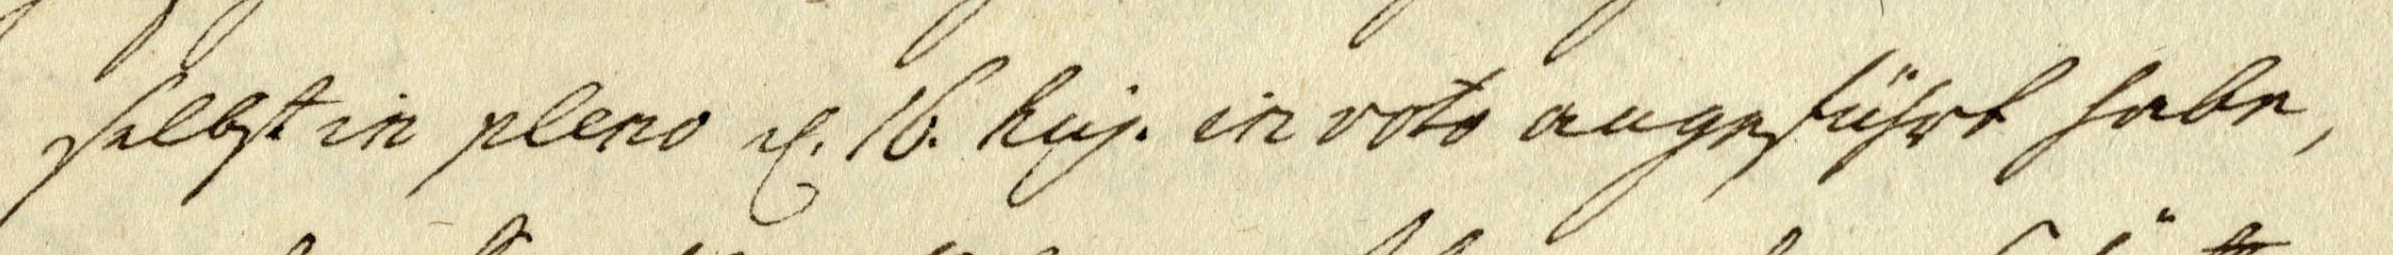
selbst in pleno d. 16. huj. in voto angeführt habe,
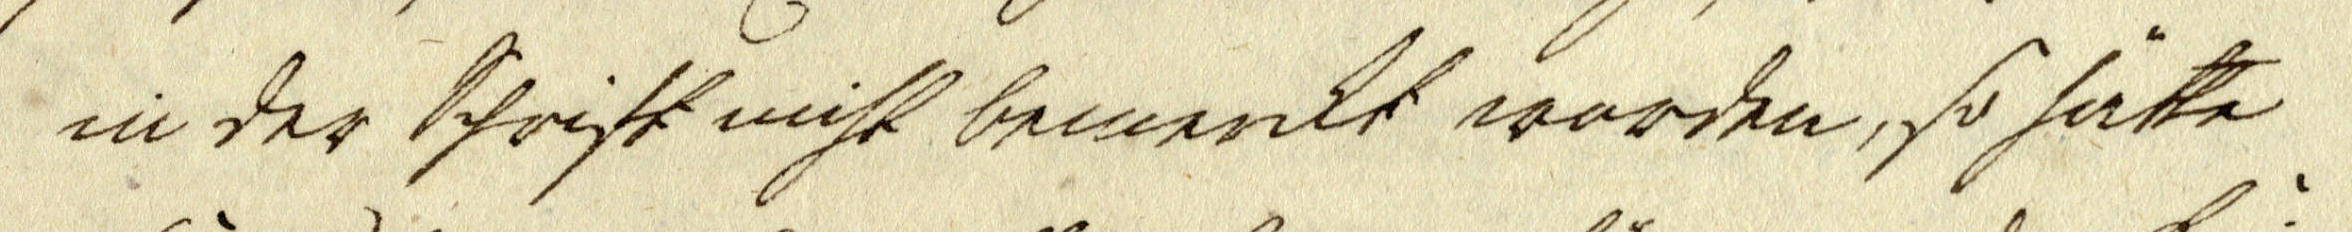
in der Schrift nicht bemerckt worden, so hätte
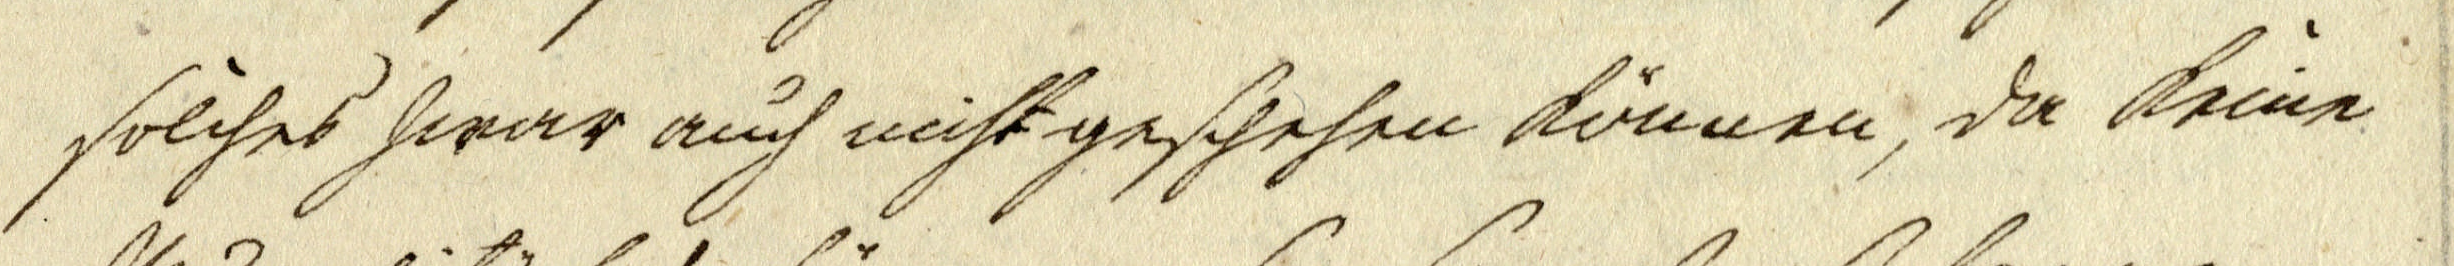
solches zwar auch nicht geschehen können, da keine
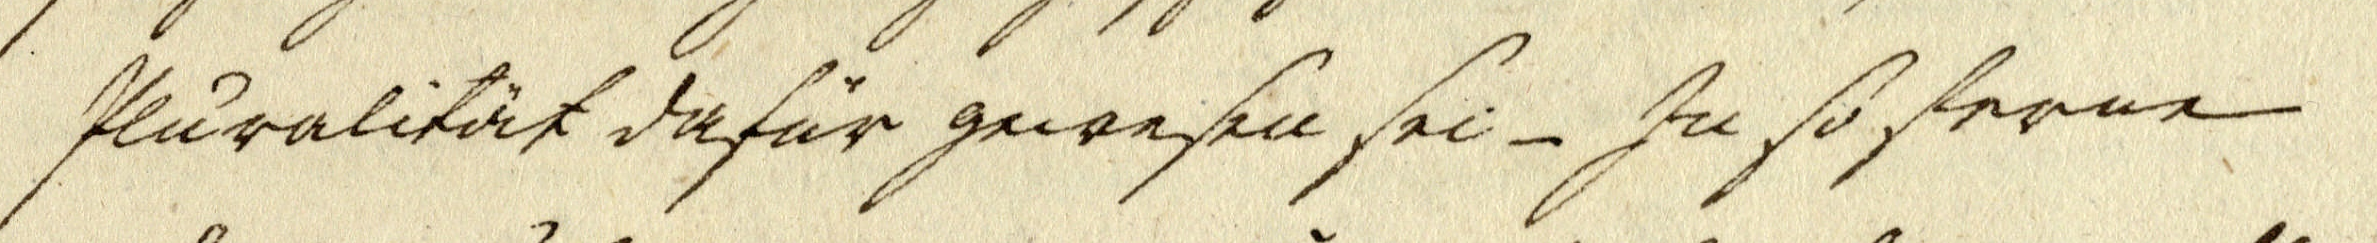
Pluralität dafür gewesen sei In so ferne
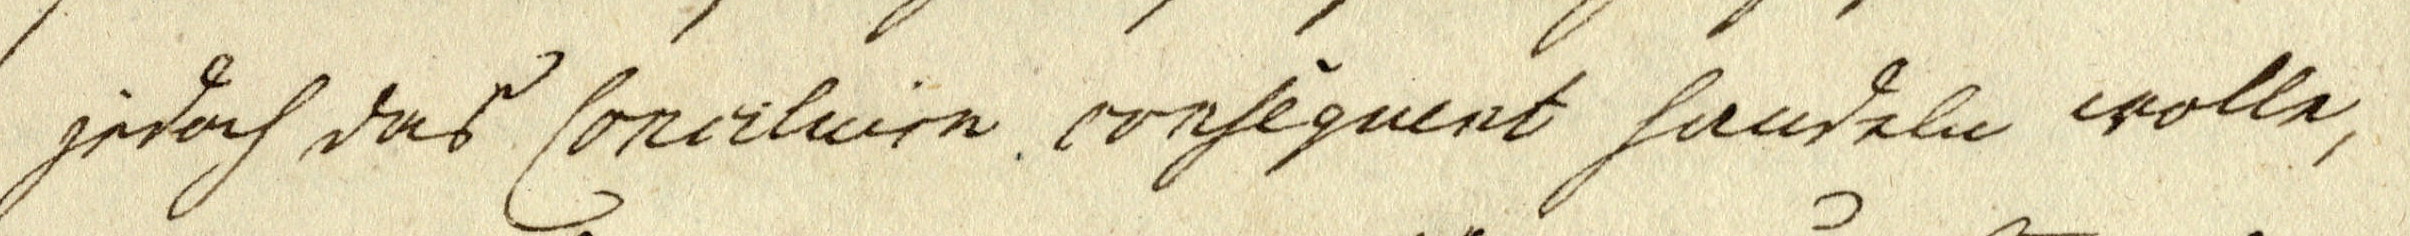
jedoch das Concilium consequent handeln wolle,
